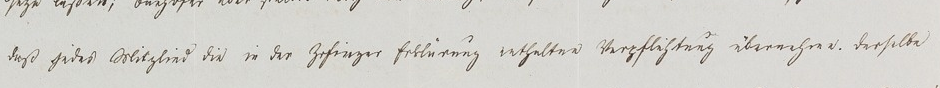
daß jedes Mitglied die in der Zofinger Erklärung enthaltne Verpflichtung übernehme. Derselbe
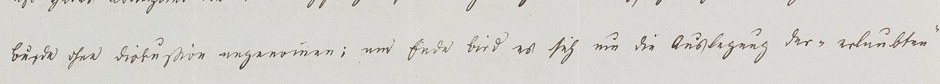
wurde ohne Diskussion angenommen; am Ende wird es sich um die Auslegung der «erlaubten»
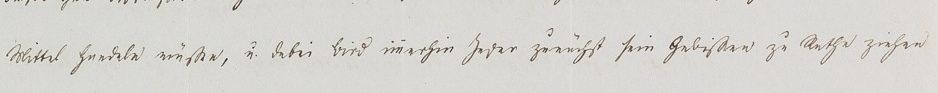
Mittel handeln müssen, u. dabei wird immerhin Jeder zunächst sein Gewissen zu Rathe ziehen
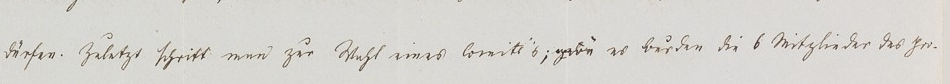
dürfen. Zuletzt schritt man zur Wahl eines Comité's; gewä es wurden die 6 Mitglieder des pro-
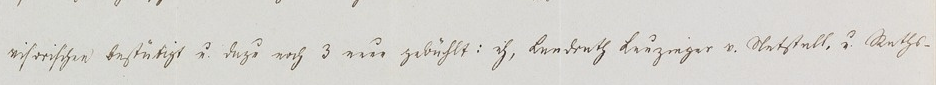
visorischen bestätigt u. dazu noch 3 neue gewählt: ich, Landrath Leuzinger v. Netstall, u. Raths-
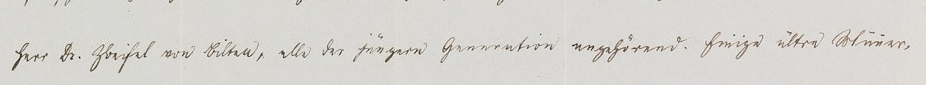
herr Dr. Zweifel von Bilten, alle der jüngern Generation angehörend. Einige ältre Männer,
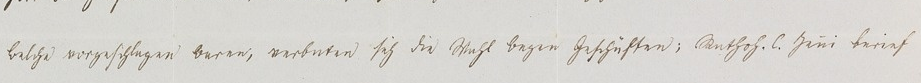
welche vorgeschlagen waren, verbaten sich die Wahl wegen Geschäften; Rathsh. C. Jenni berief
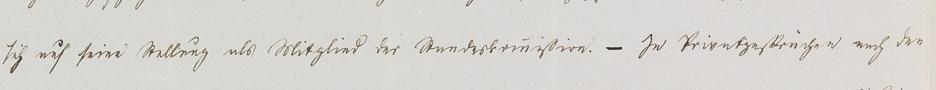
sich auf seine Stellung als Mitglied der Standeskommission. – In Privatgesprächen nach den
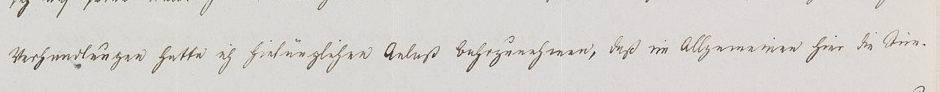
Verhandlungen hatte ich hinlänglichen Anlaß wahrzunehmen, daß im Allgemeinen hier die Stim-
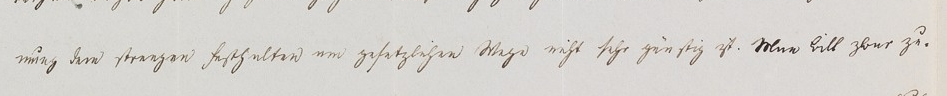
mung dem strengen Festhalten am gesetzlichen Wege nicht sehr günstig ist. Man will zwar zu-
